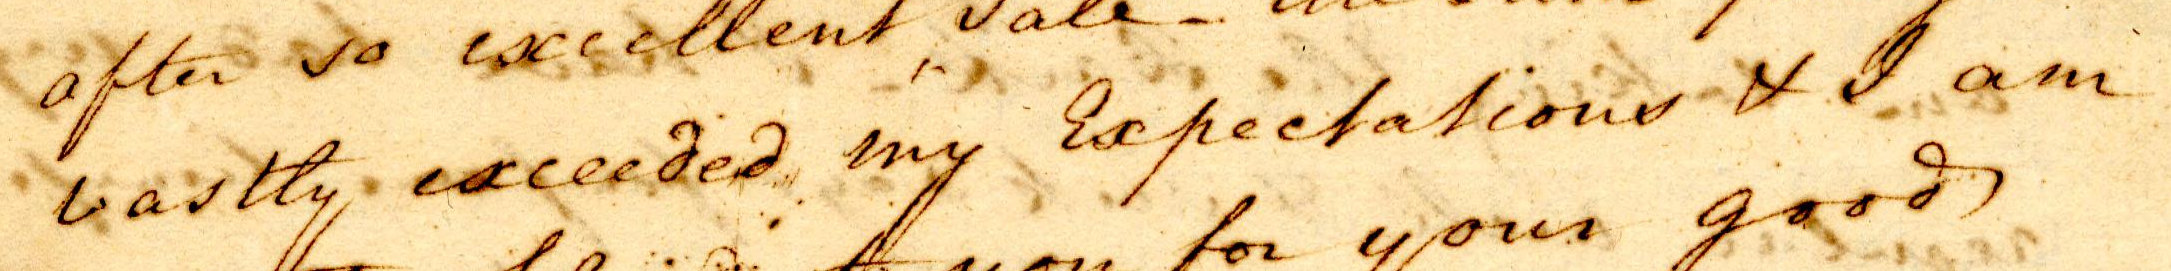vastly exceeded my Expectations & I am
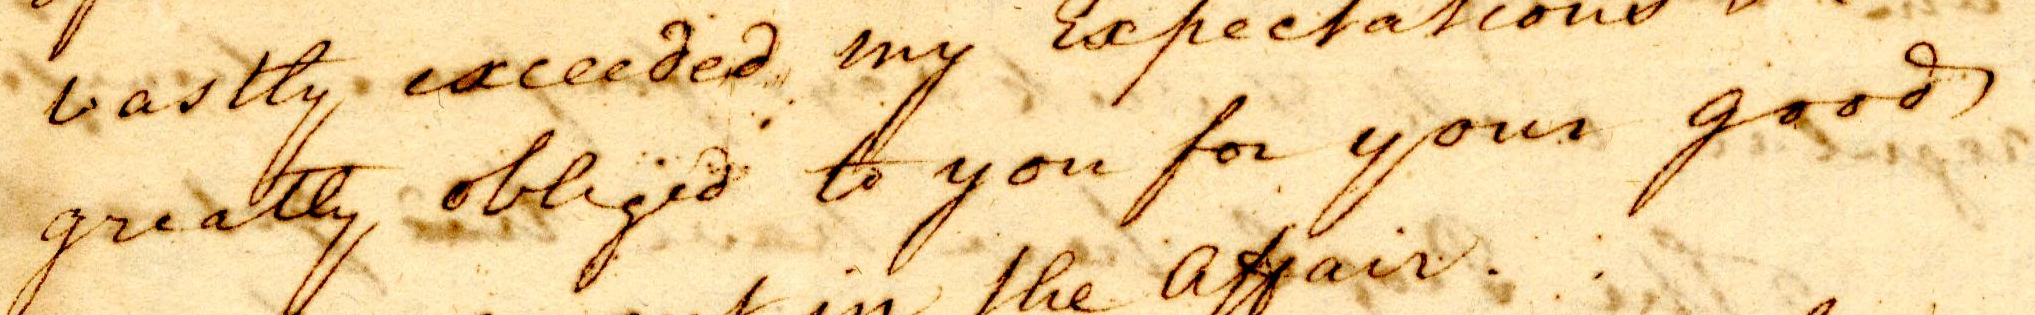greatly obliged to you for your good
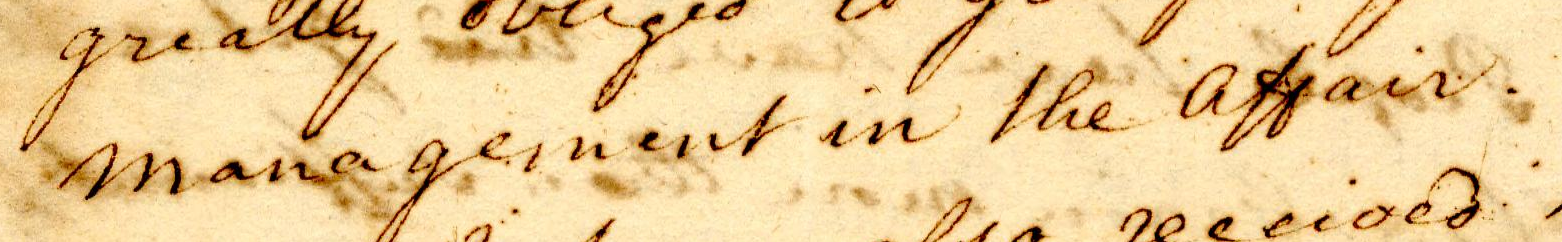management in the Affair.
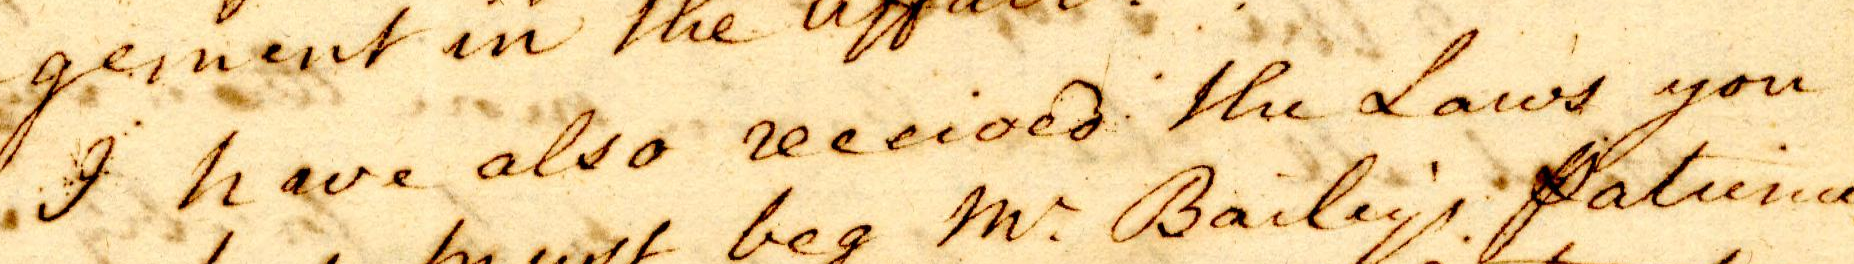I have also received the Laws you
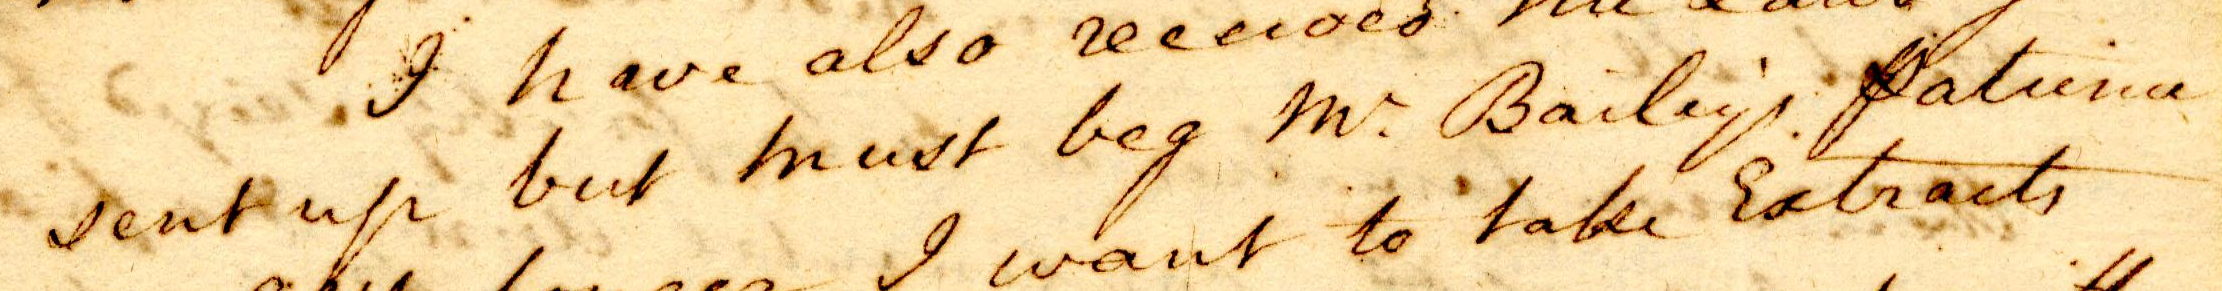sent up but must beg M^r. Bailey's Patience
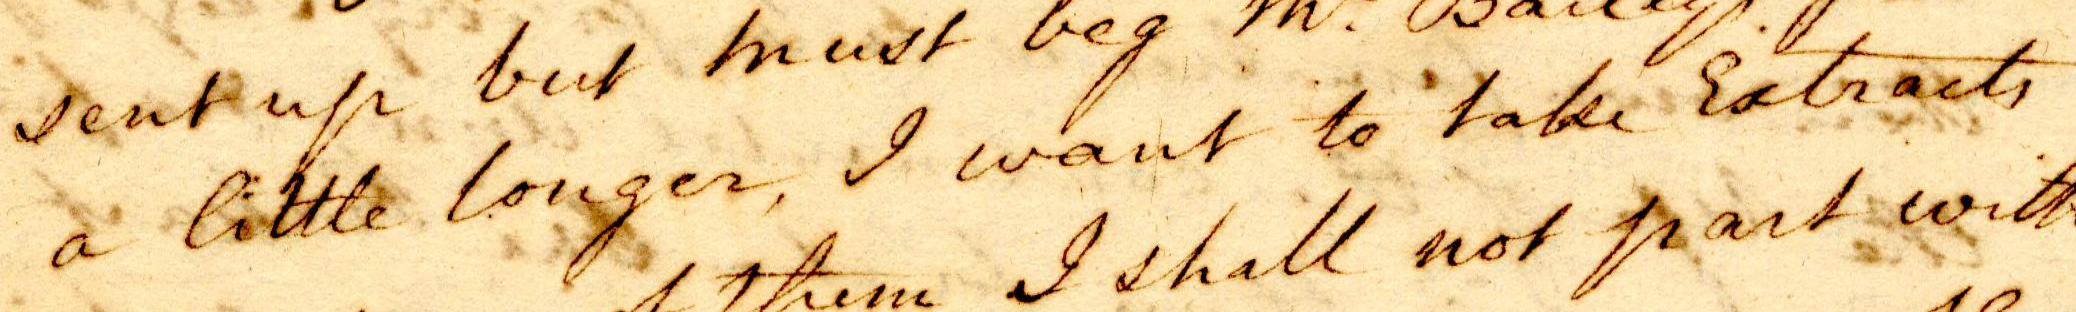a little longer. I want to take Extracts
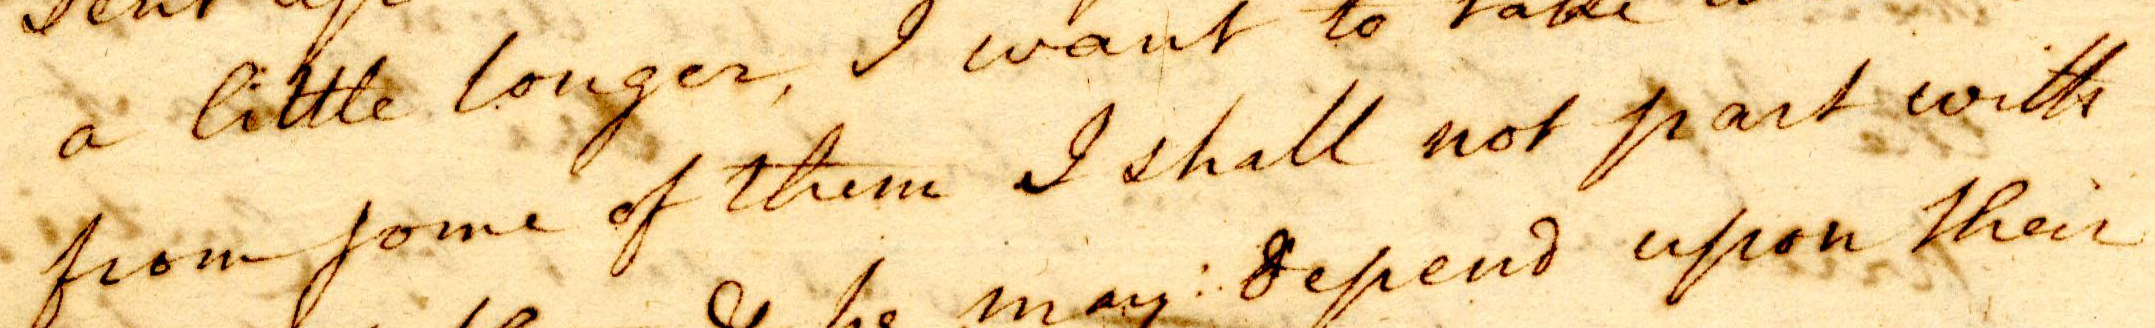from some of them I shall not part with
